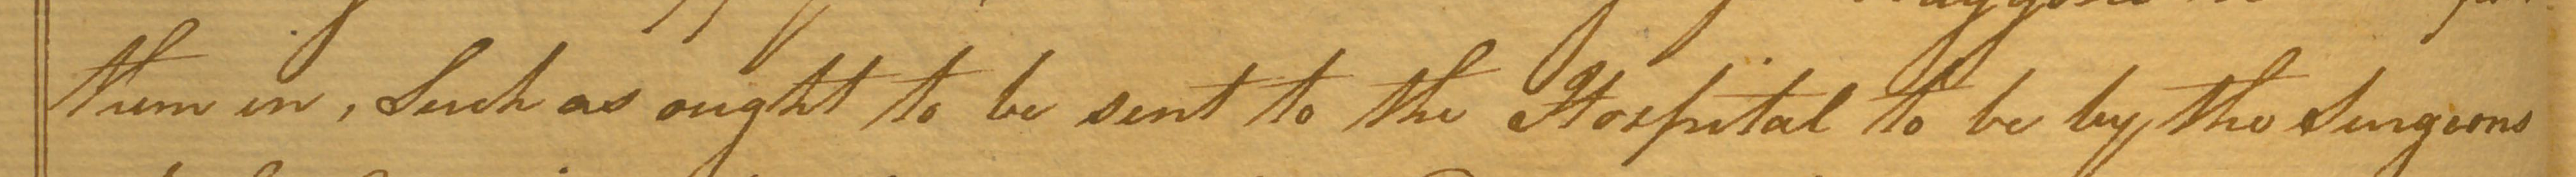them in, Such as ought to be sent to the Hospital to be by the Surgeons
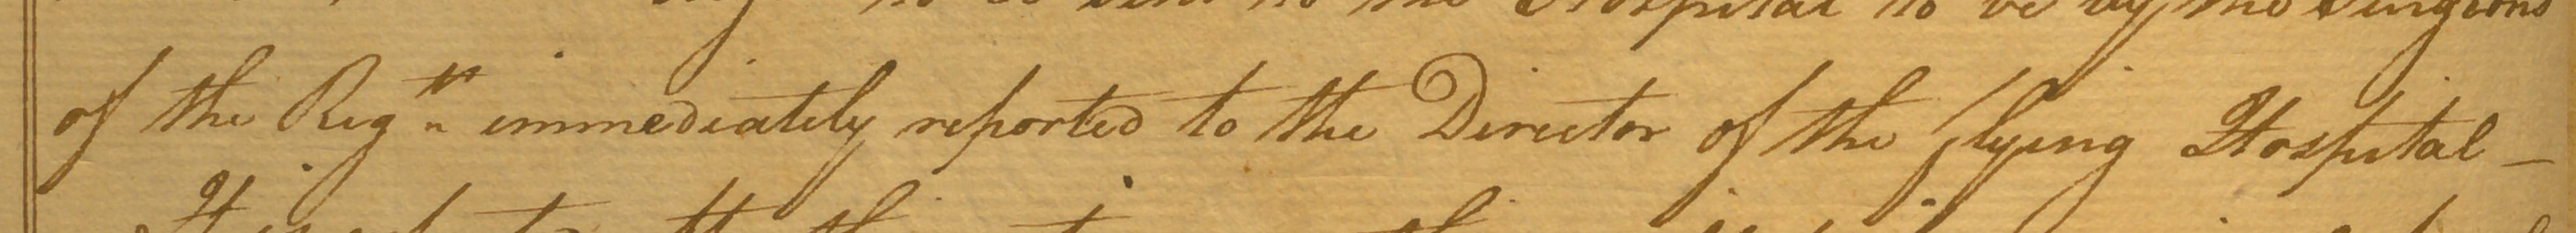of the Reg^ts. immediately reported to the Director of the Flying Hospital-
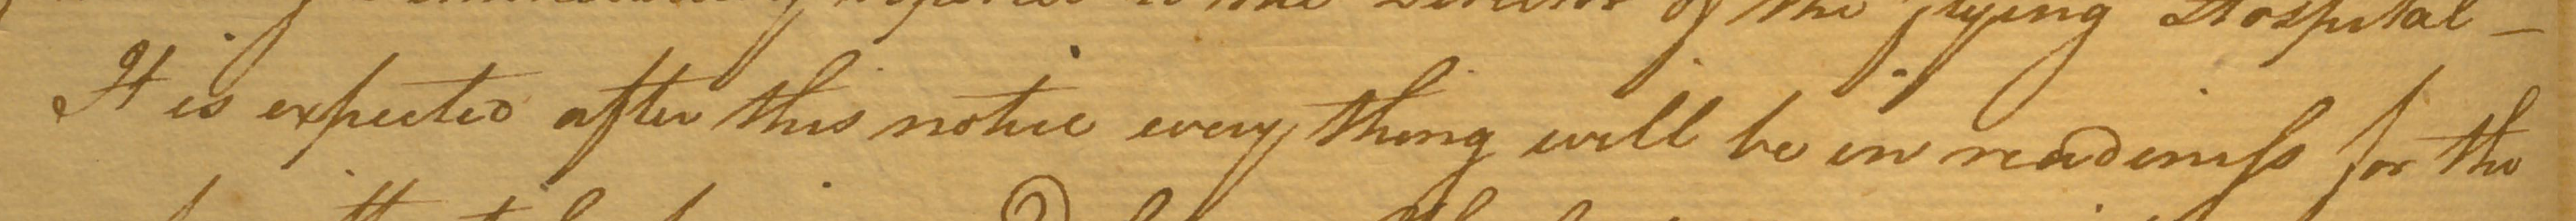It is expected after this notice every thing will be in readiness for the
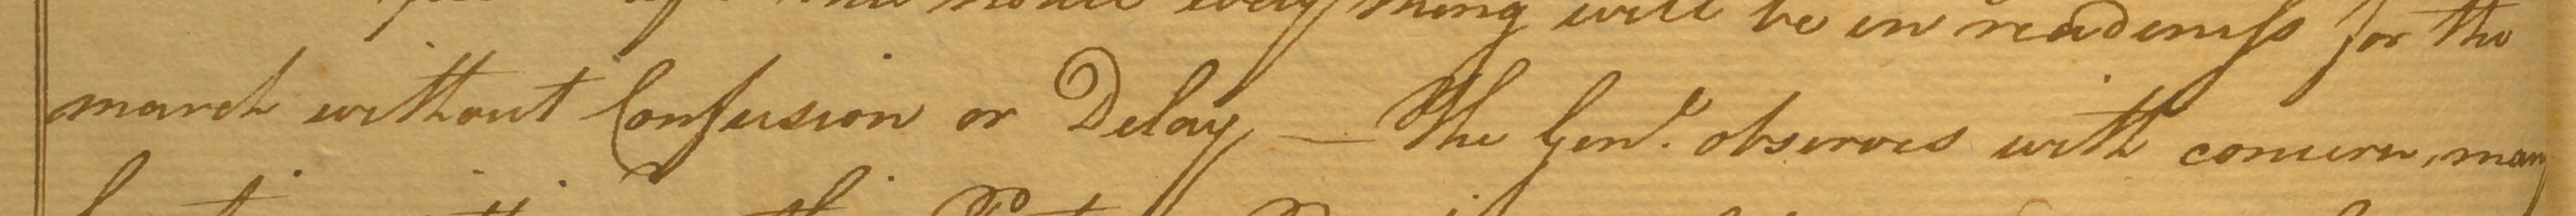march without Confusion or Delay- The Gen^l. observes with concern, many
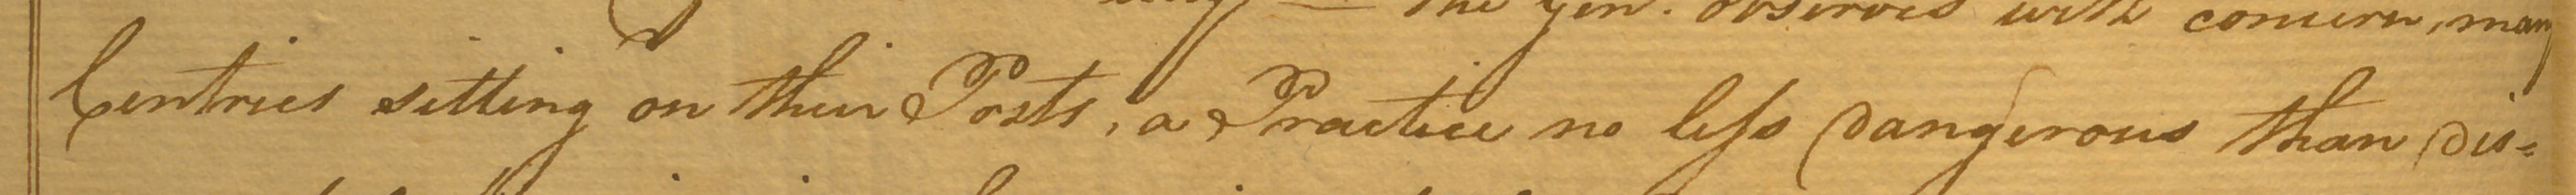Centries sitting on their Posts, a Practice no less dangerous than dis-
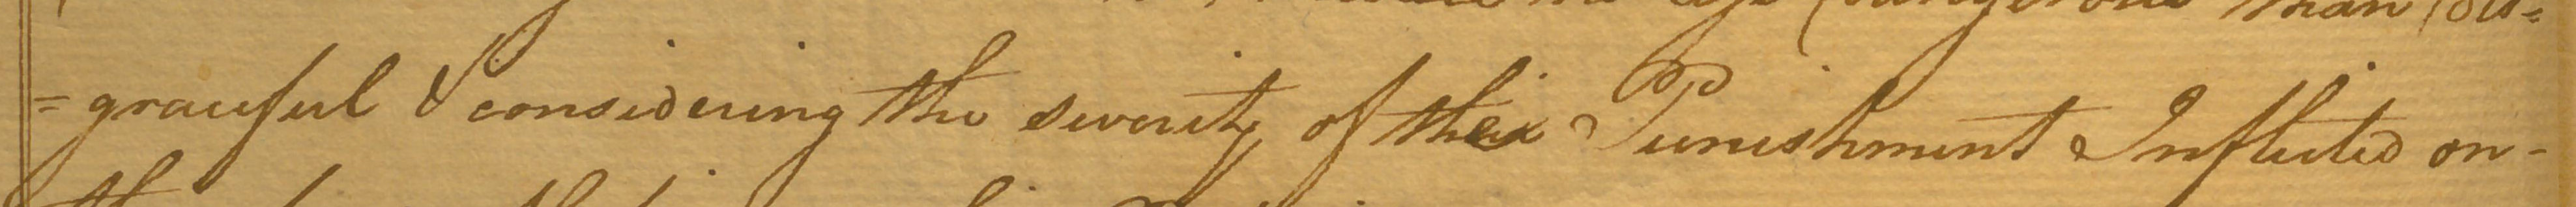-graceful & considering the severity of the Punishment Inflicted on
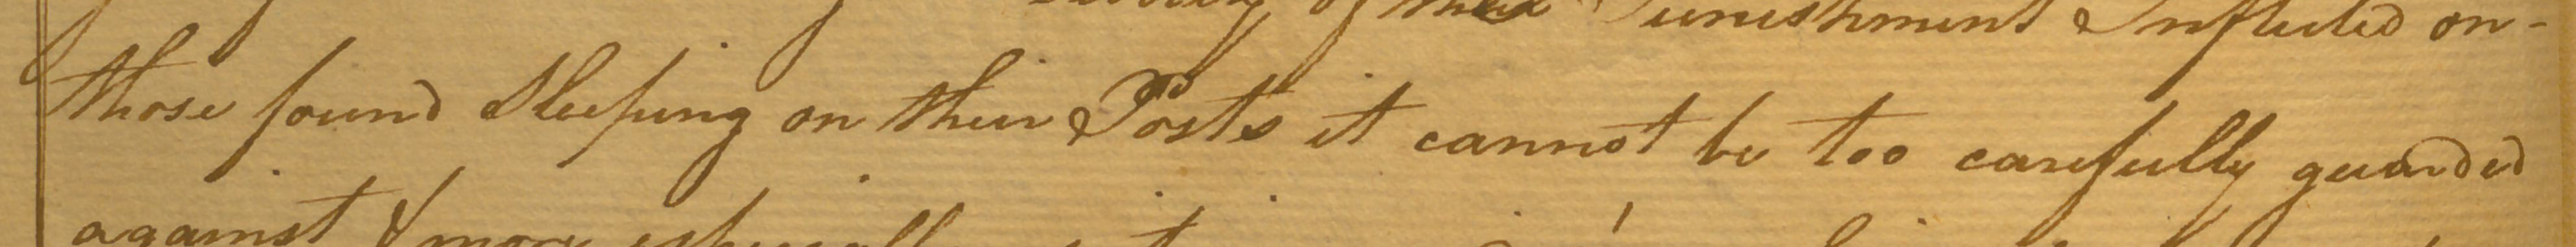those found Sleeping on their Posts it cannot be too carefully guarded
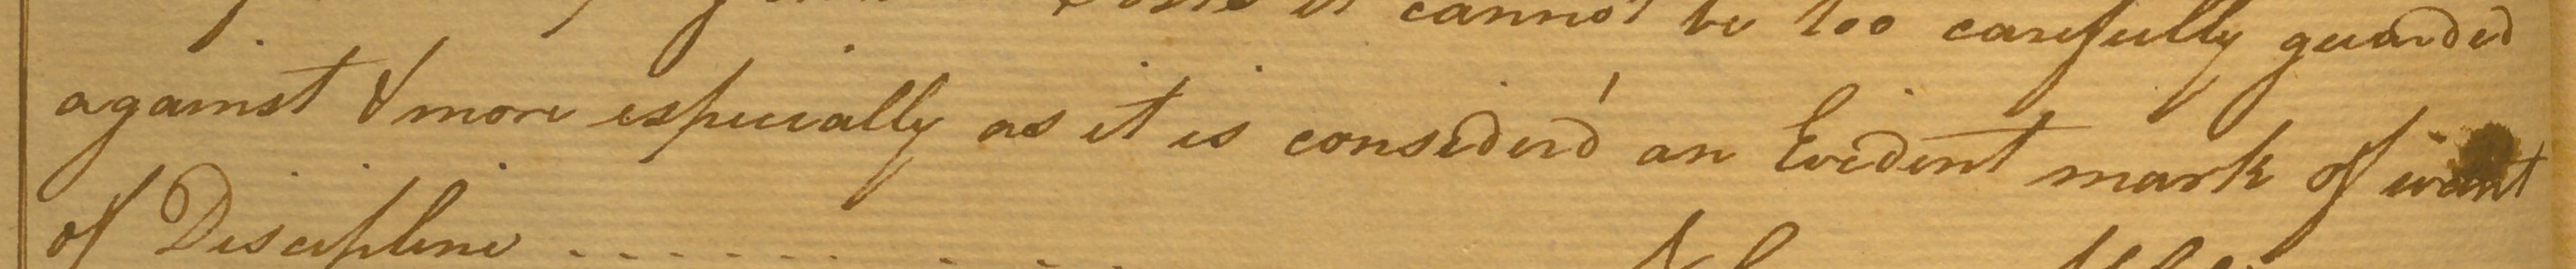against & more especially as it is consider'd an Evident mark of want
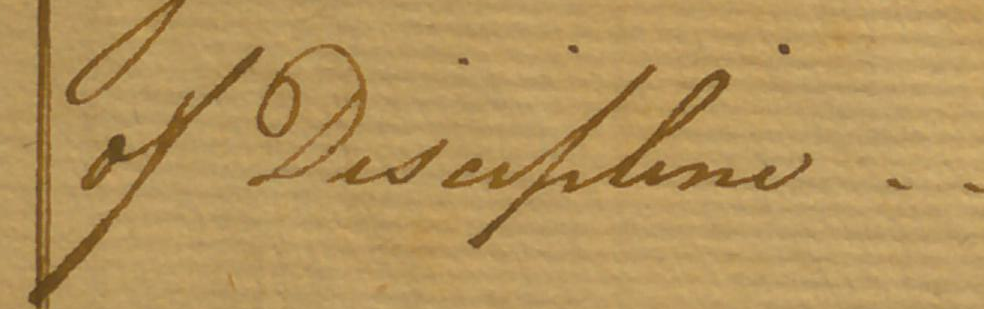of Discipline.
